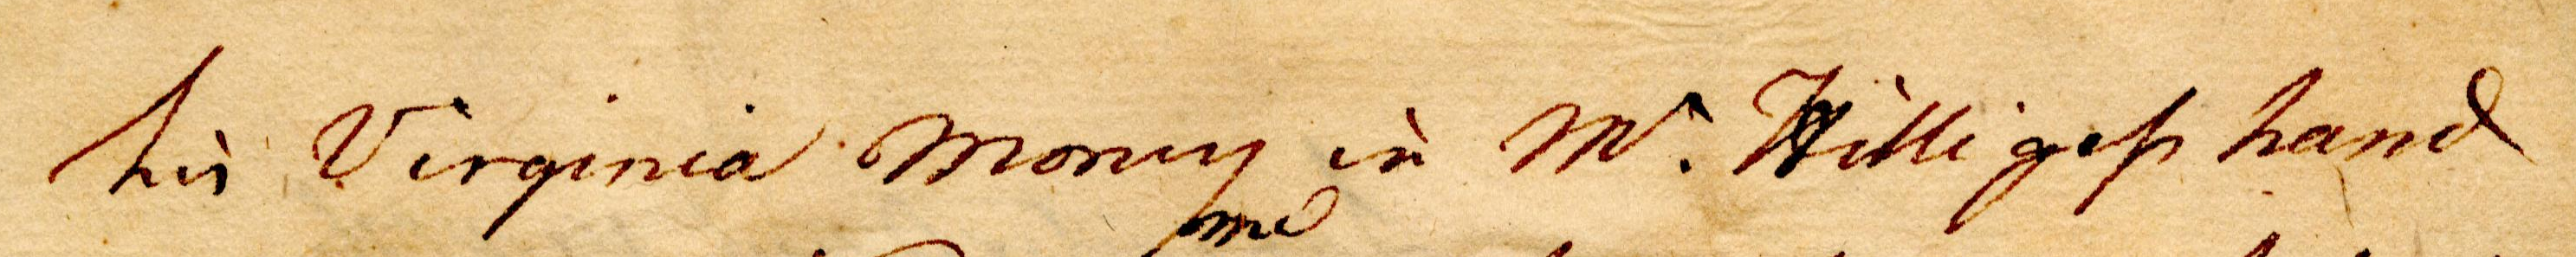his Virginia money in M^r. Hilligess hand
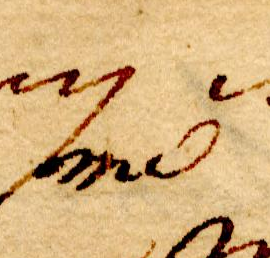me
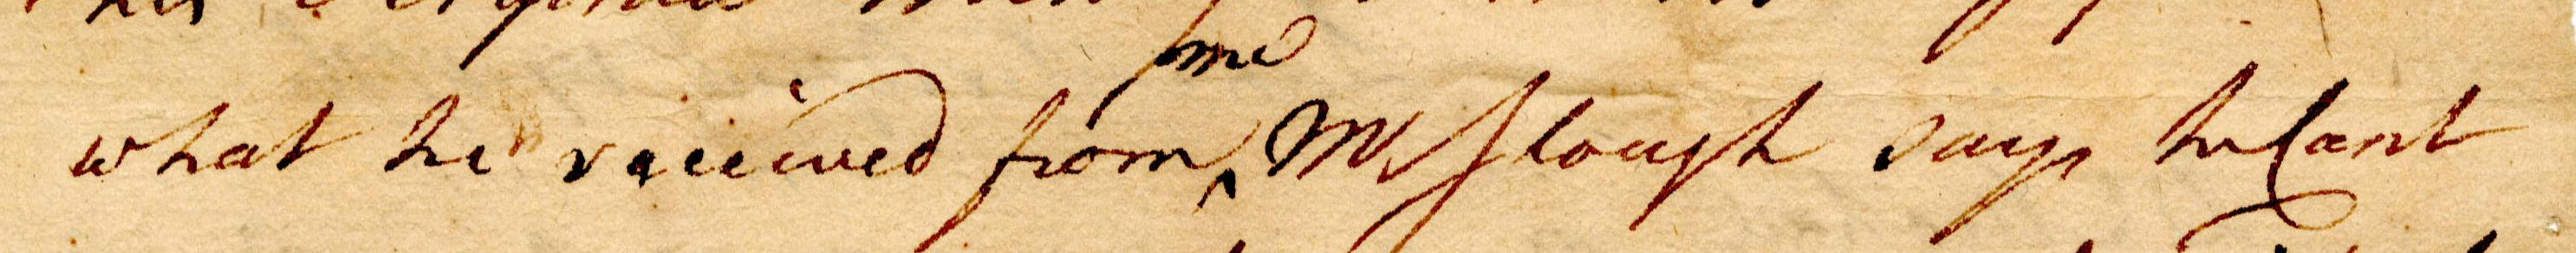what he received from ^ M^r. Slough says he Cant
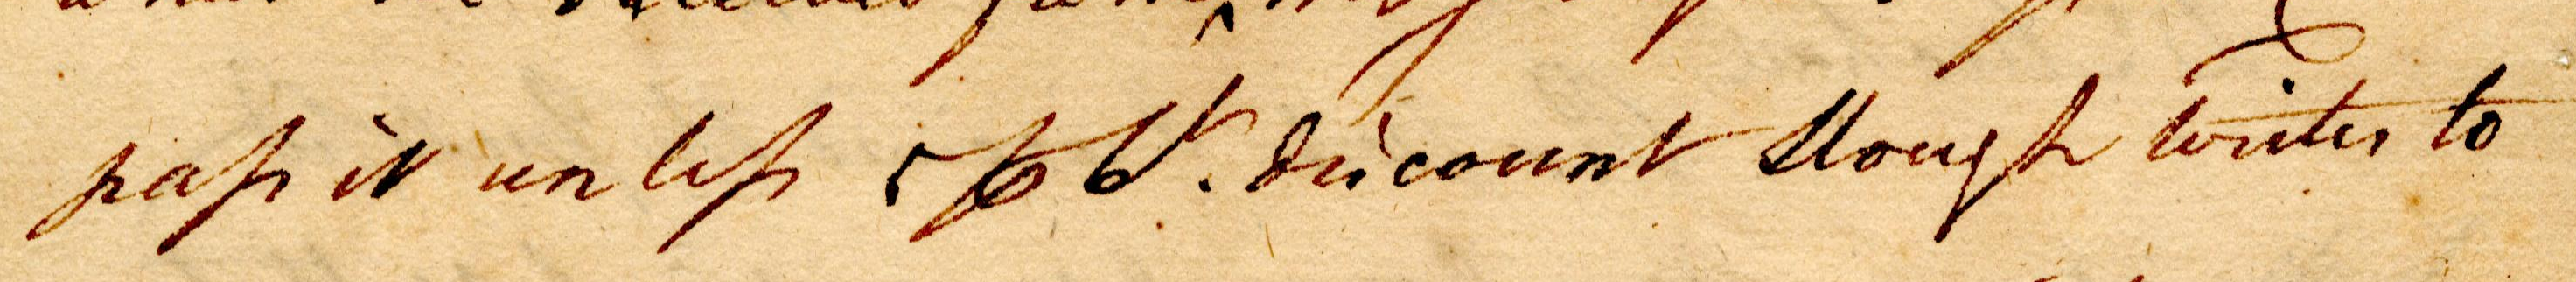pass it unless 5 per 6 is count Slough writes to
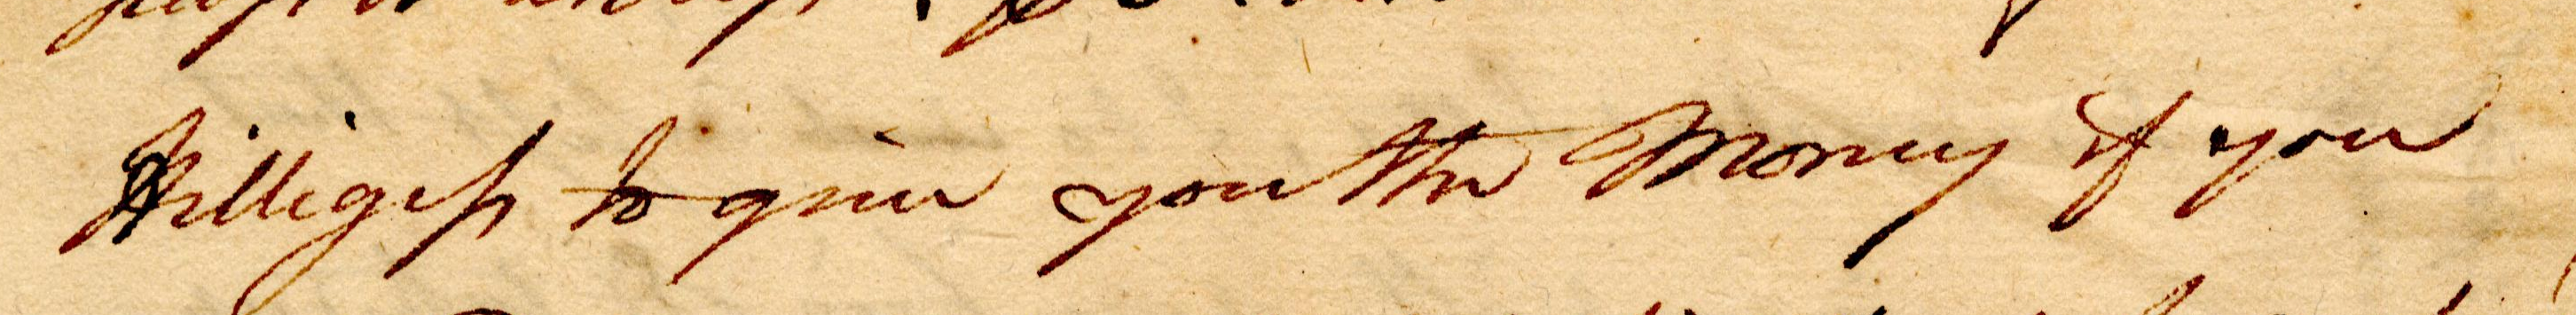Hilligess to give you the Money if you
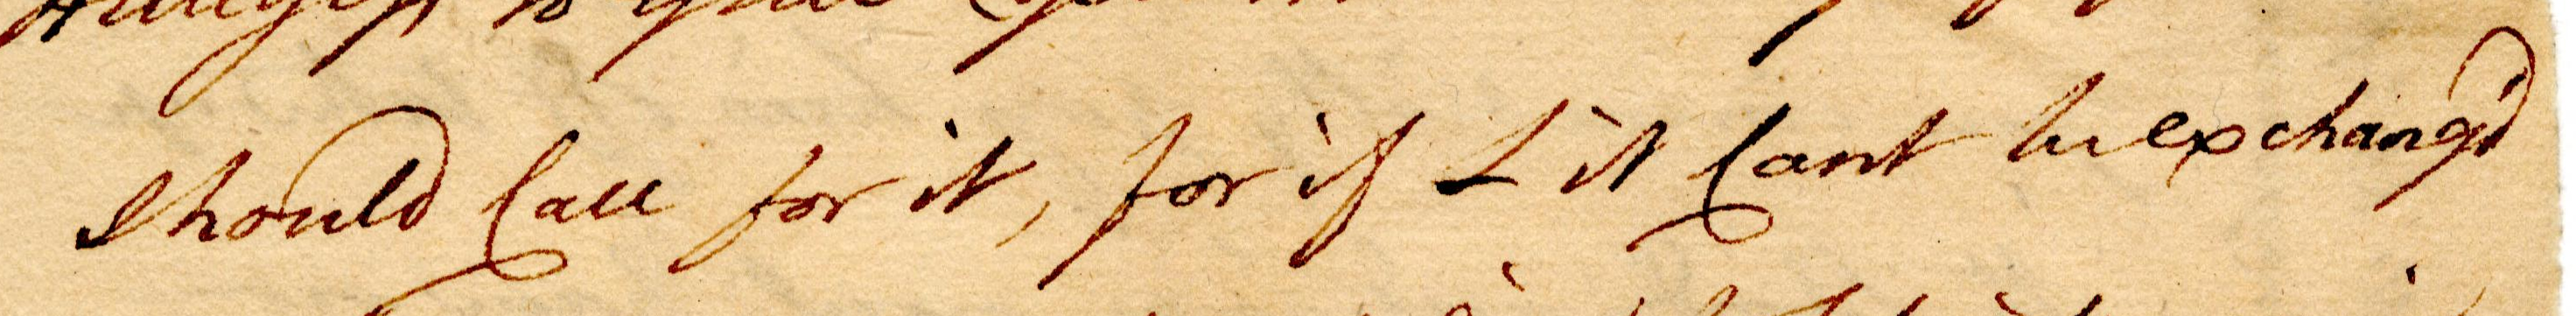should Call for it, for if & it Cant be exchang'd
